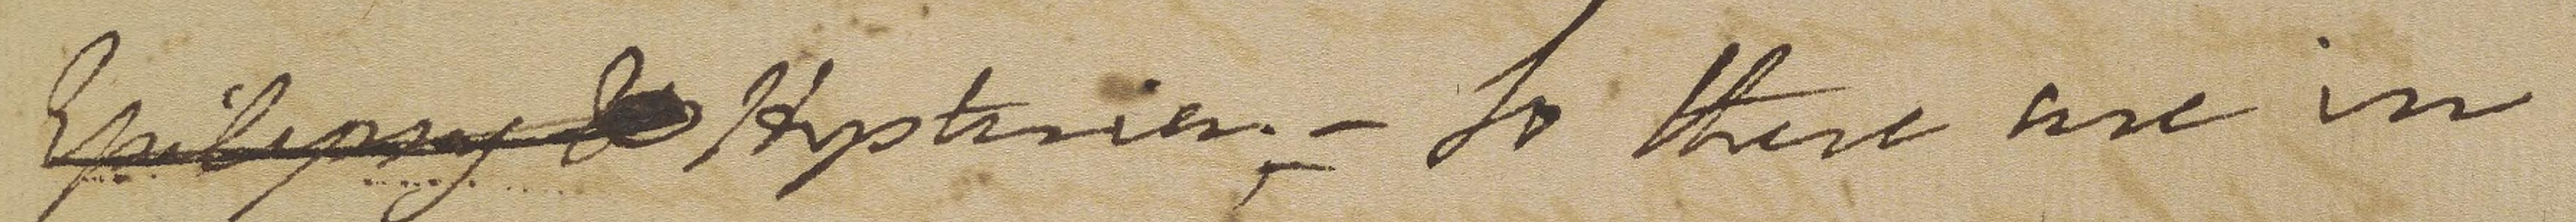[Epilepsy &] Hysteria. So there are in
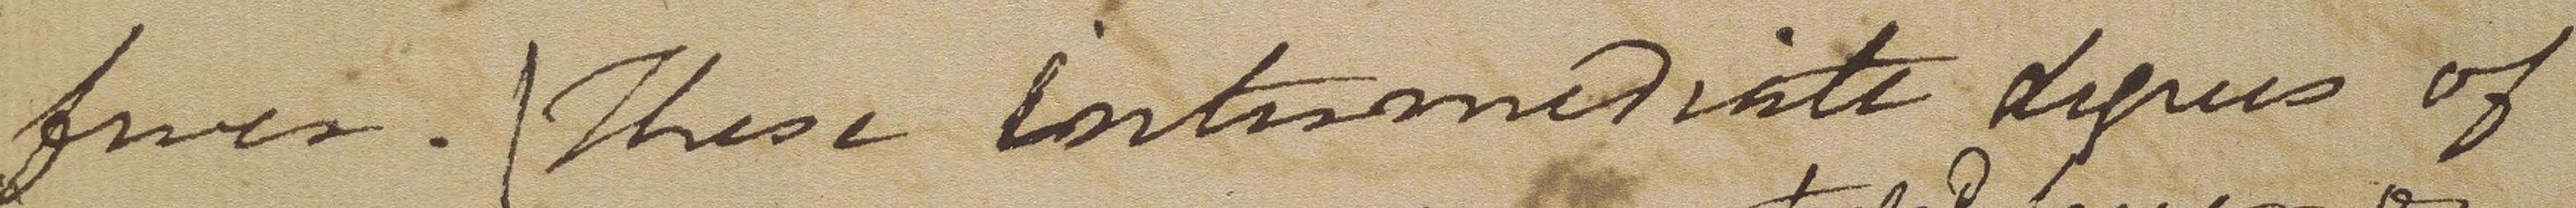fever. /These intermediate degrees of
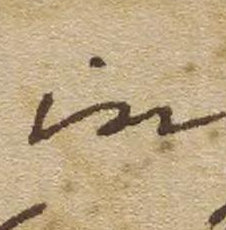in
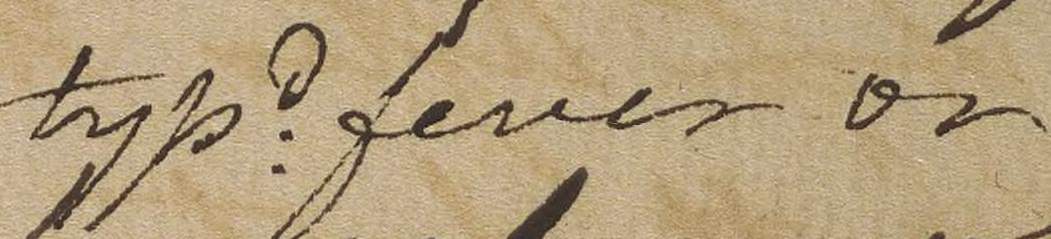typ^d: fever or
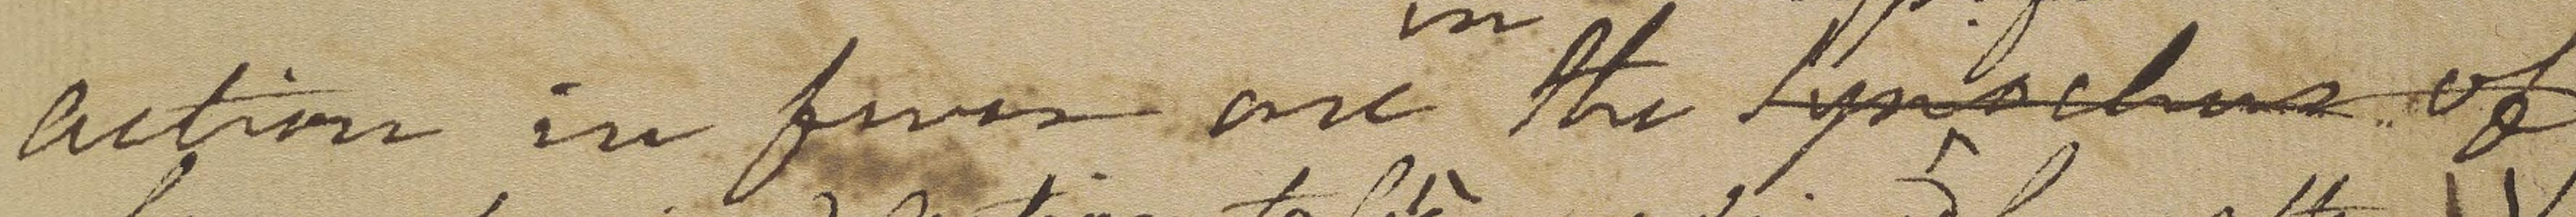action in fever are ^ the [symptoms] ^ of
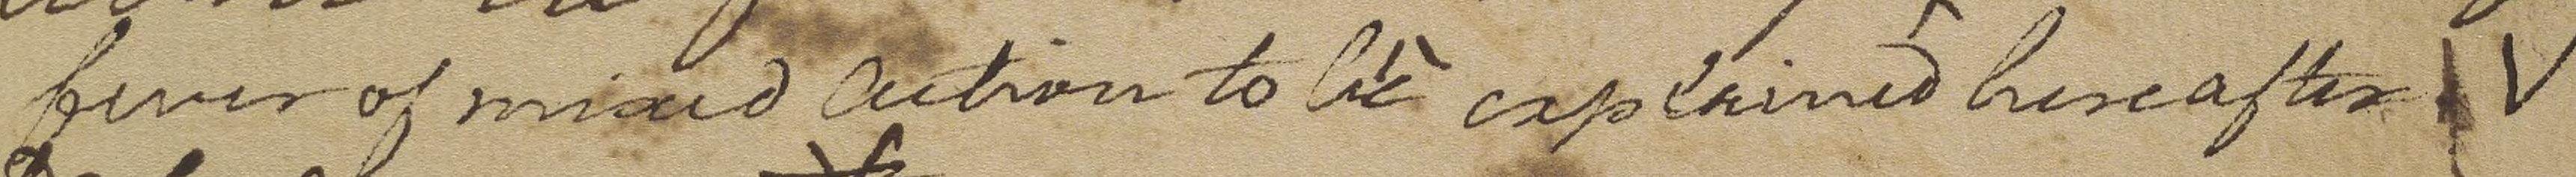fever of mixed action to be explained hereafter
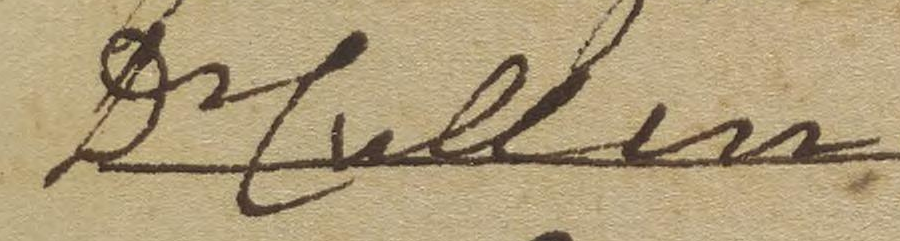D^r Cullen
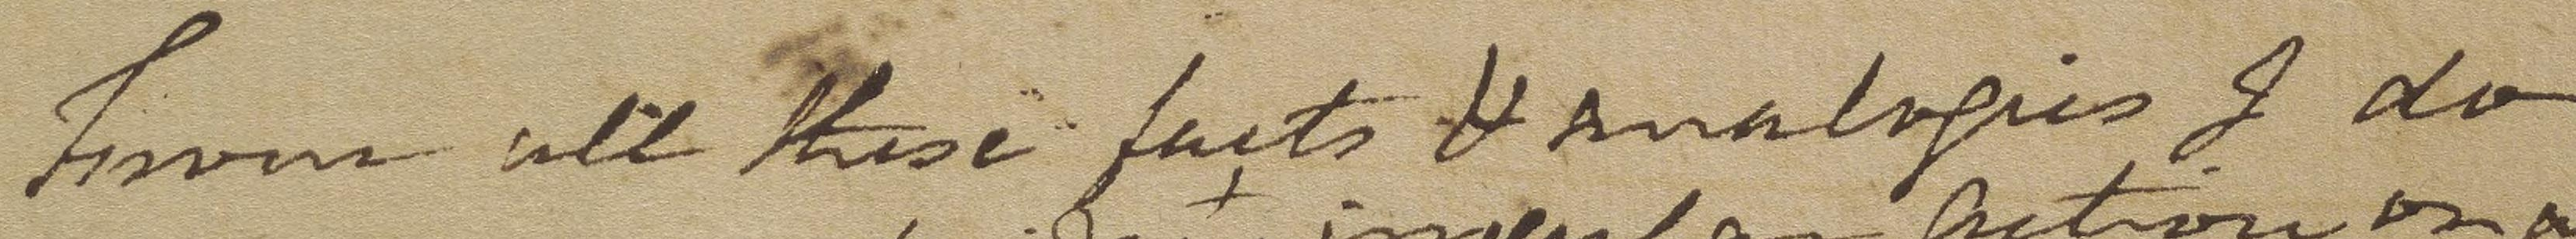From all these facts & analgoies I do
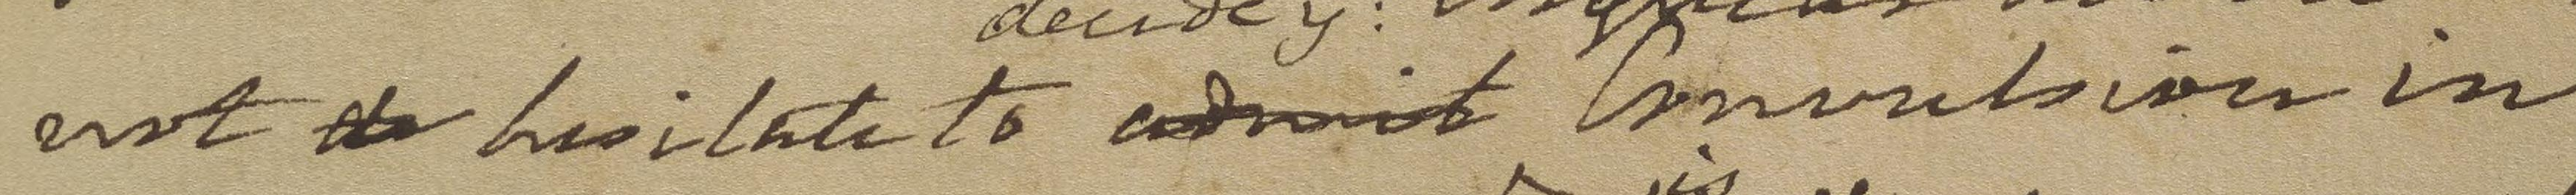not hesitate to [admit] ^ Convulsions in
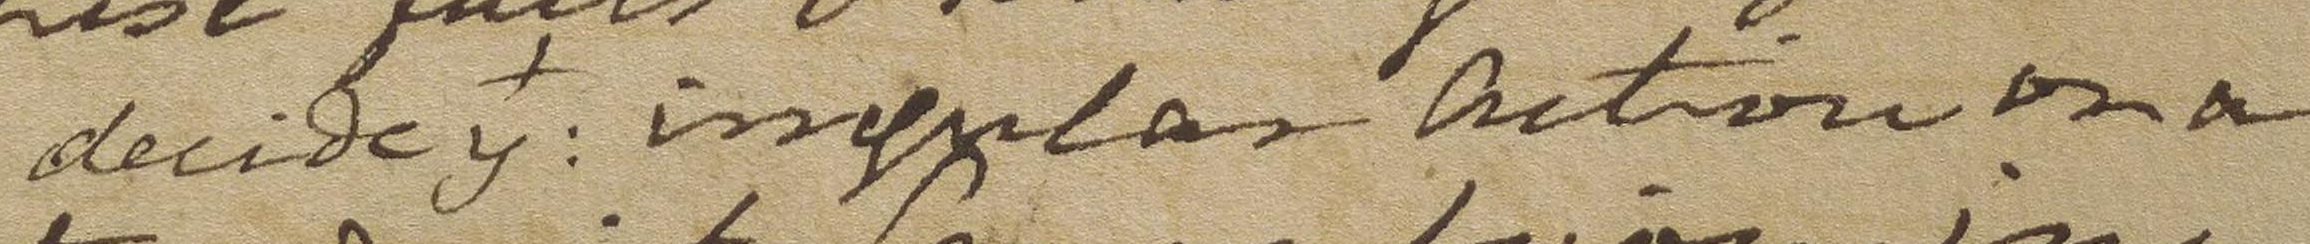decide y^t irregular Action or a
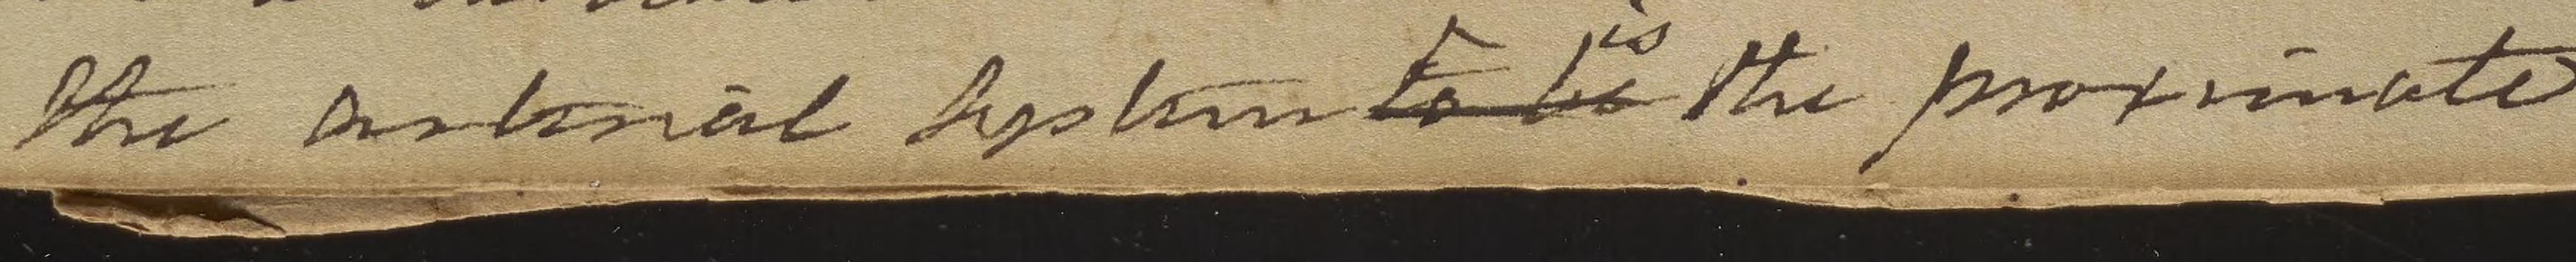the arterial system to be is the proximate
